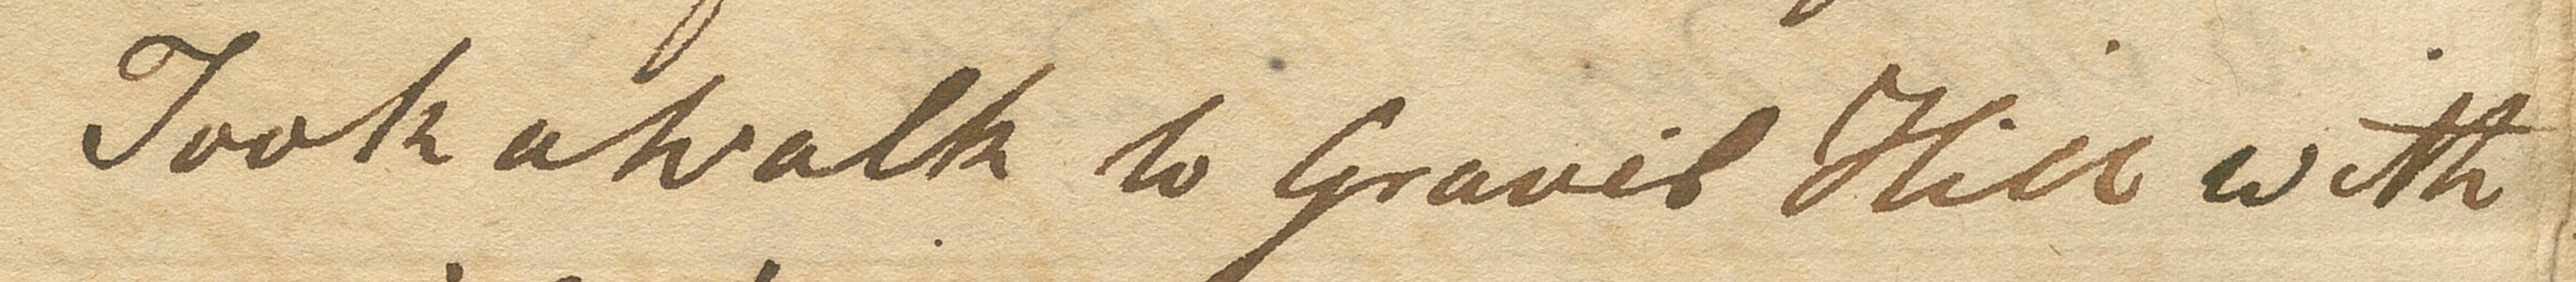Took a walk to Gravel Hill with
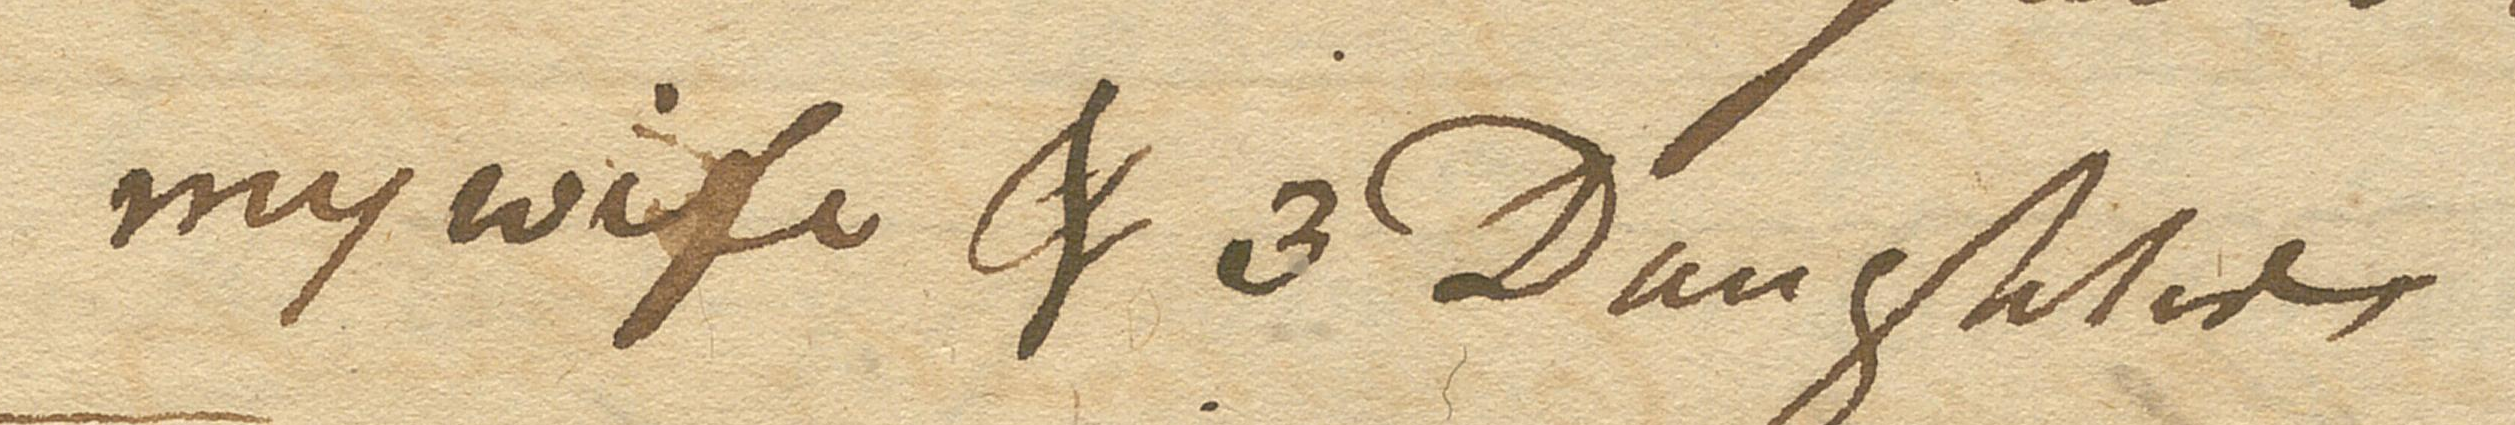my wife & 3 Daughters
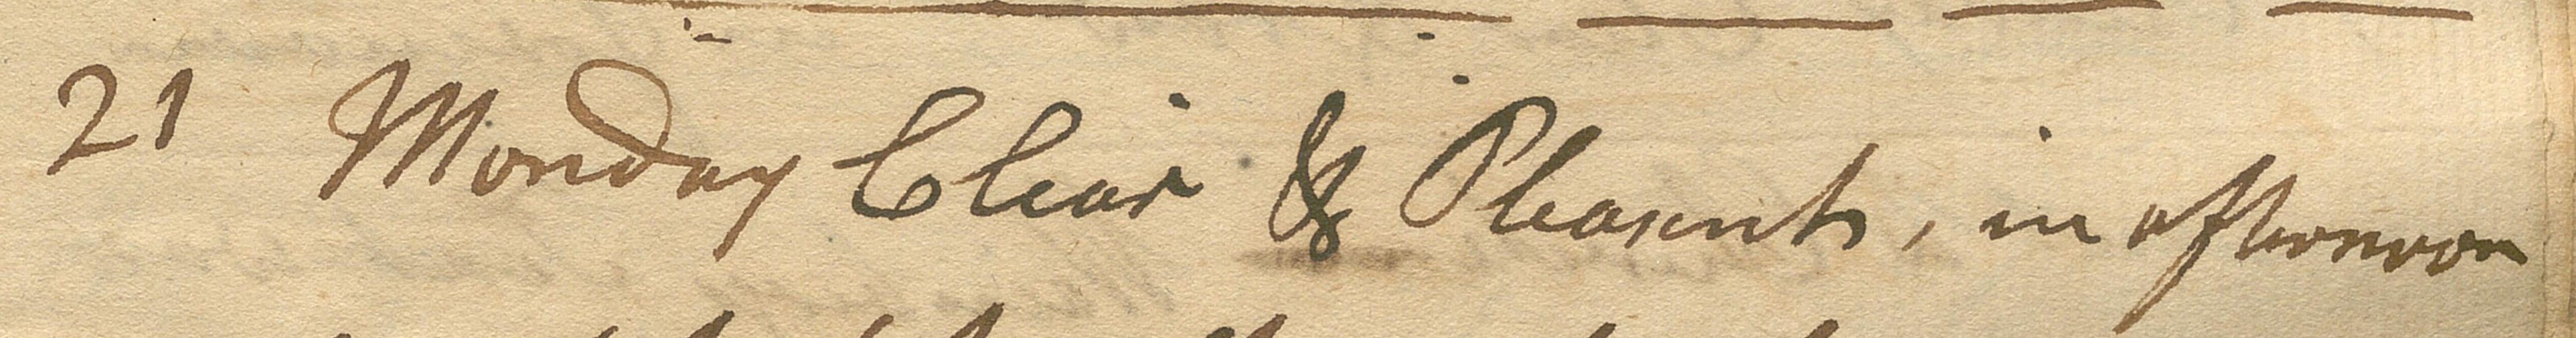21 Monday Clear & Pleasent, in afternoon
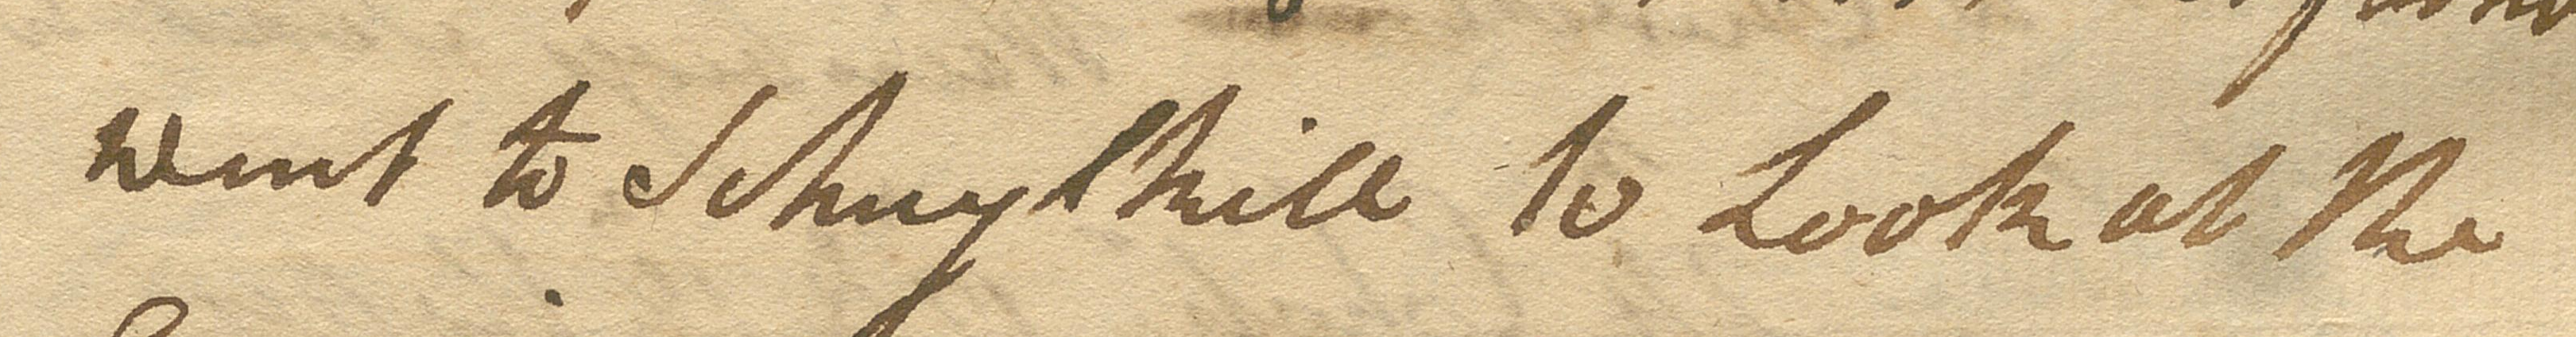went to Schuylkill to Look at the
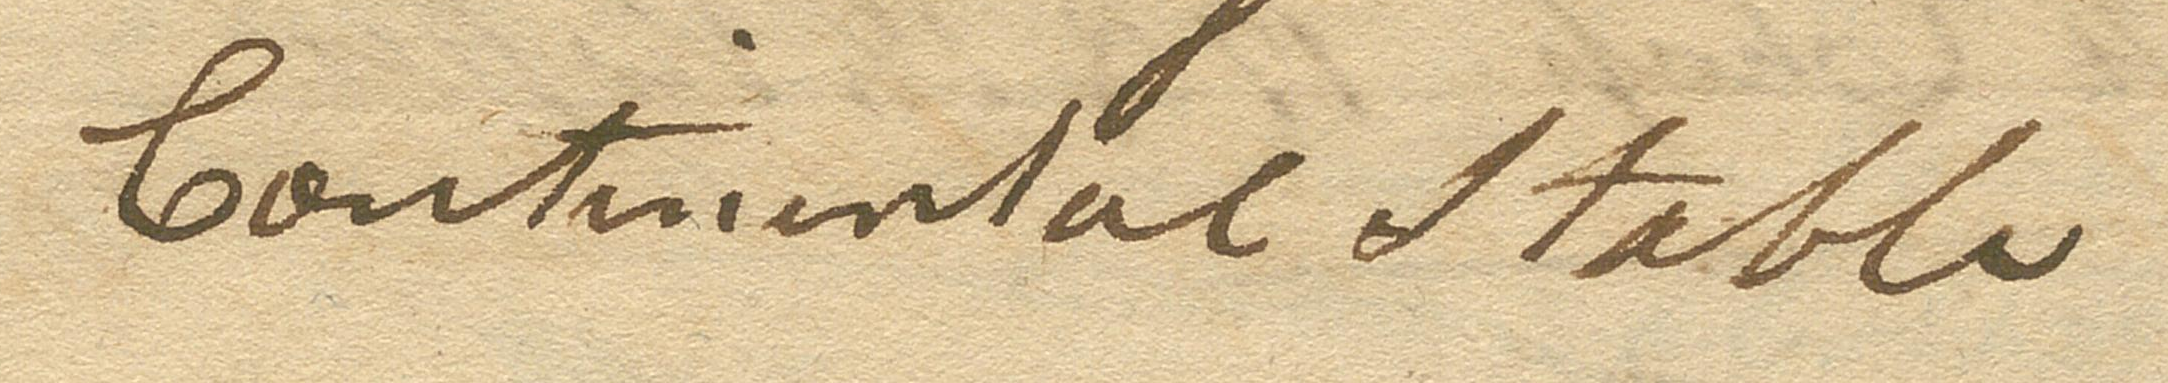Continental Stable
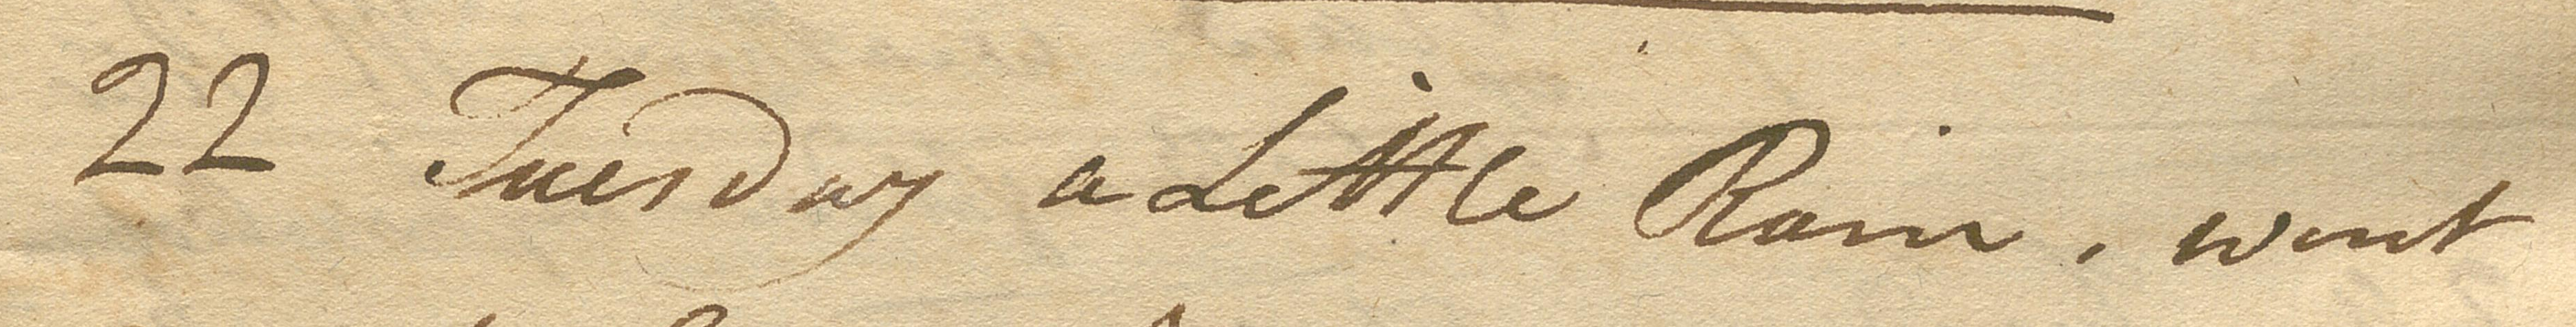22 Tuesday a Little Rain, went
